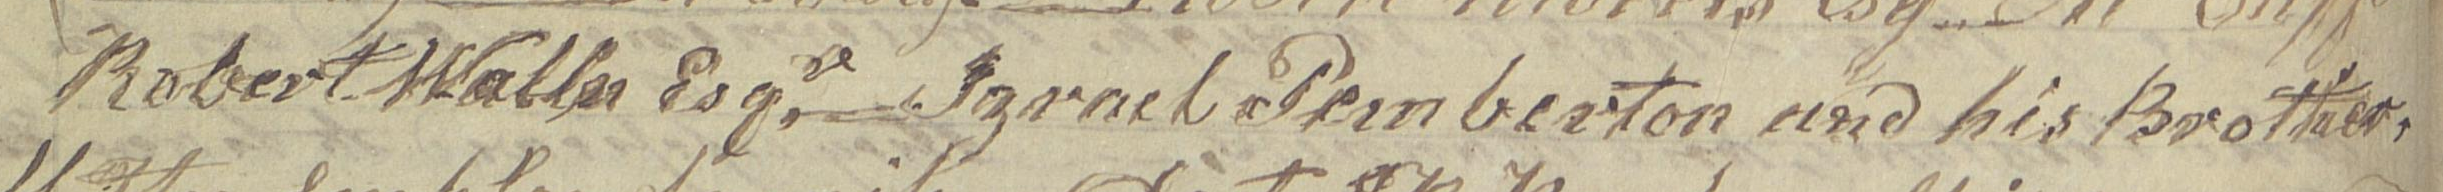Robert Waller Esq^r Izrael Pemberton and his Brother,
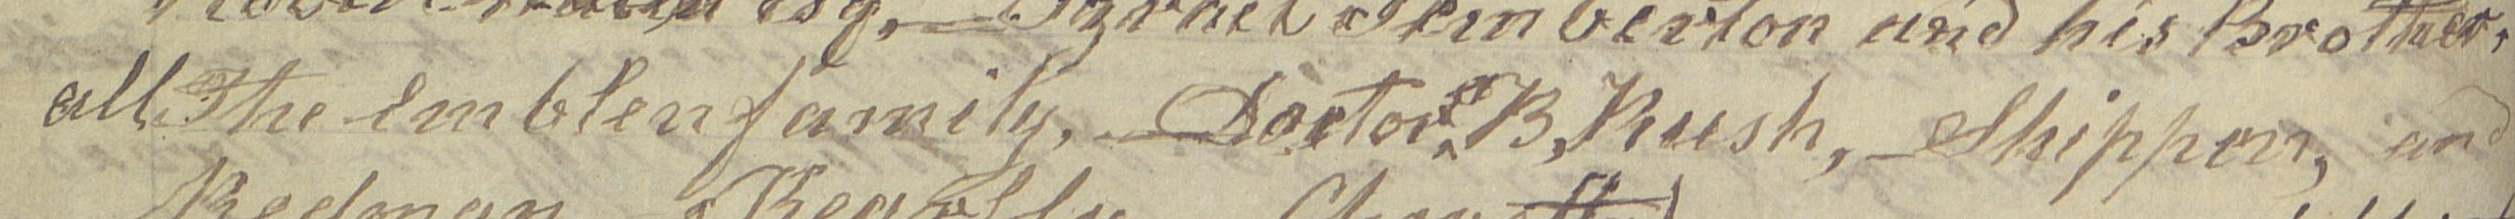all the Emblen family, Doctor B Rush, Shippen, and
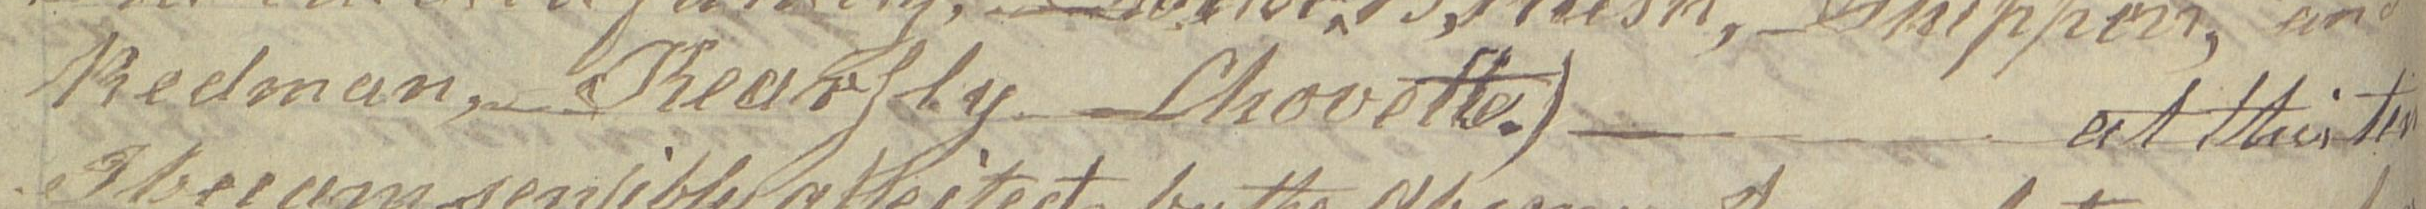Redman, Rearfly, Chovette.) at this time
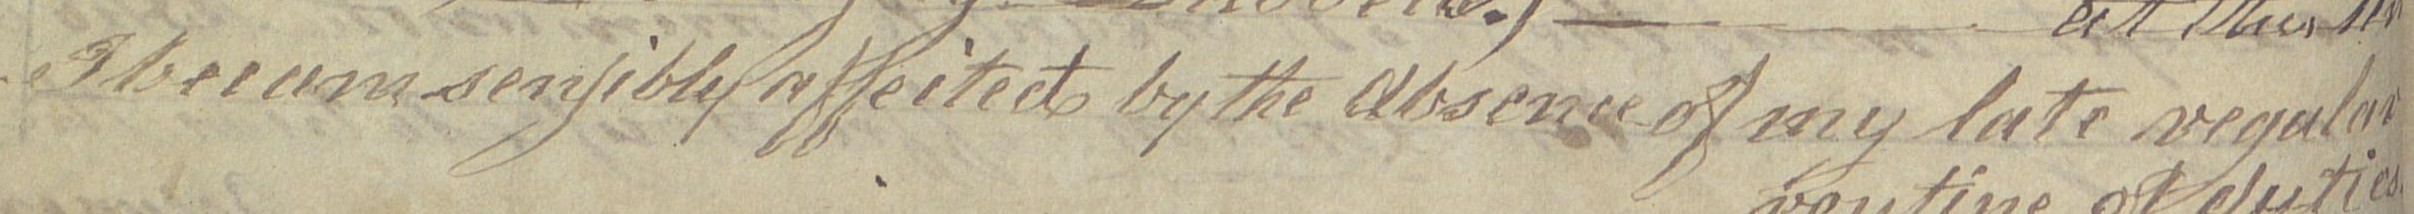I becam sensibly affected by the Absence of my late regular
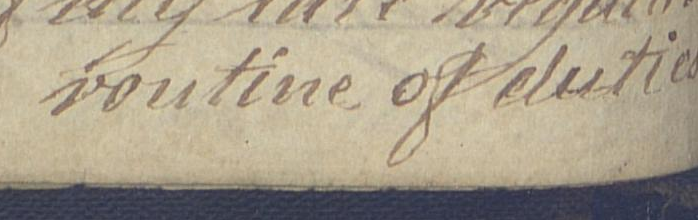routine of duties
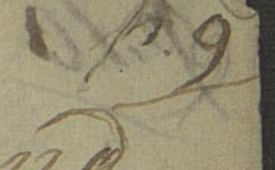p. 9
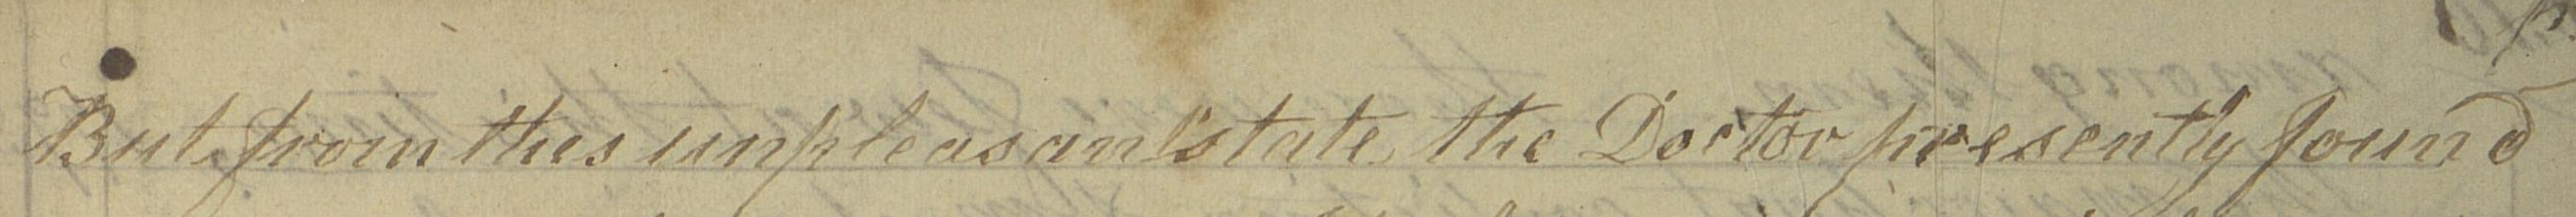But from this unpleasant state the Doctor presently found
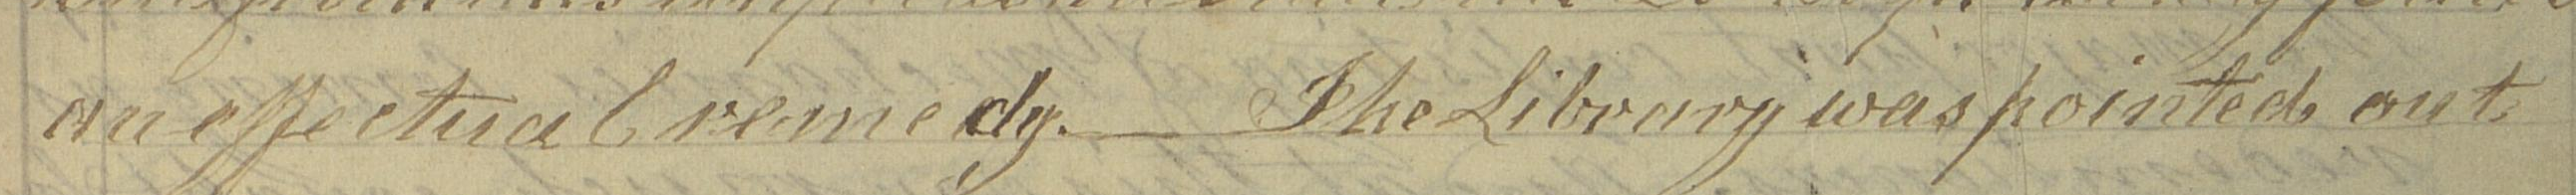an effectual remedy. The Library was pointed out
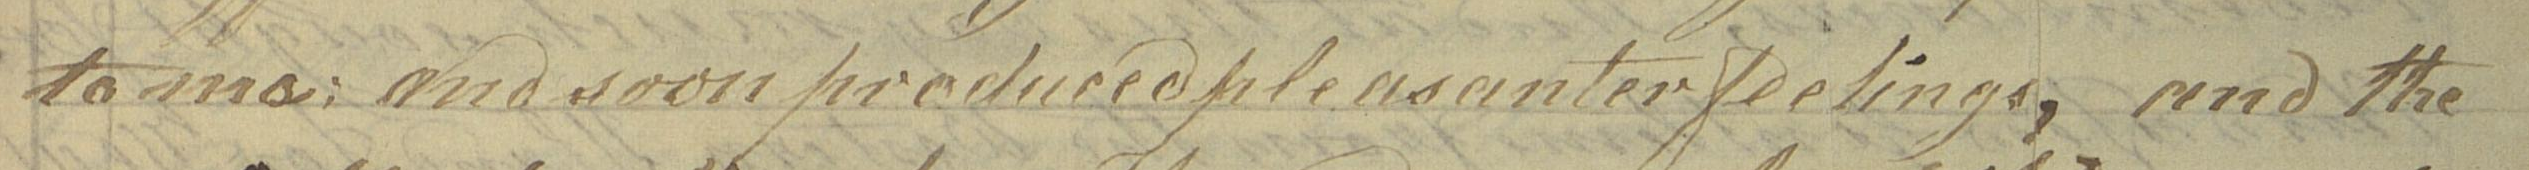to me: and soon produced pleasanter feelings, and the
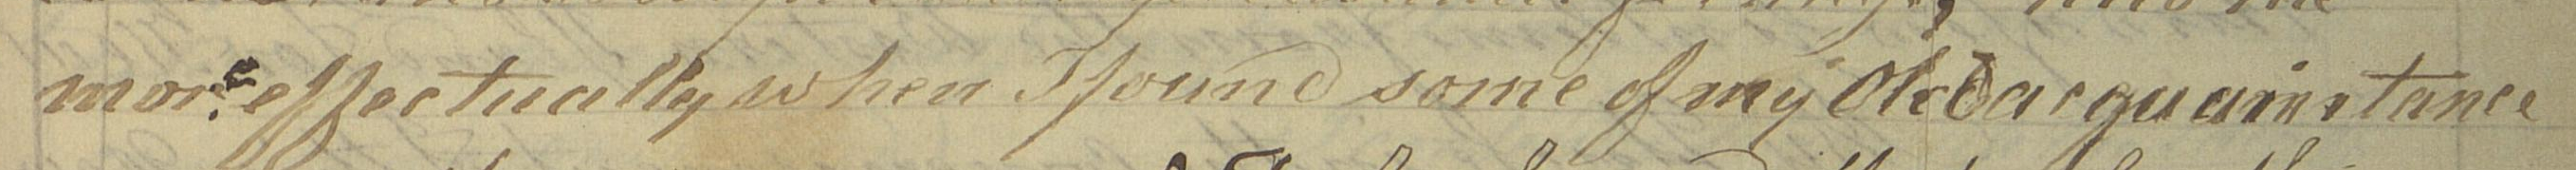more effectually wheir I found some of my old acquaintance
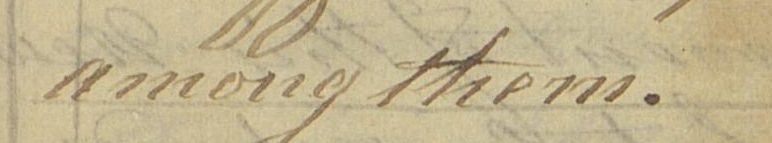among them.
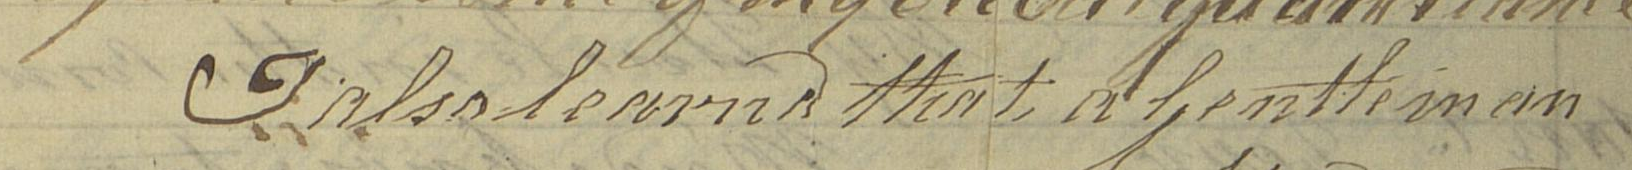I also learned that a Gentleman
